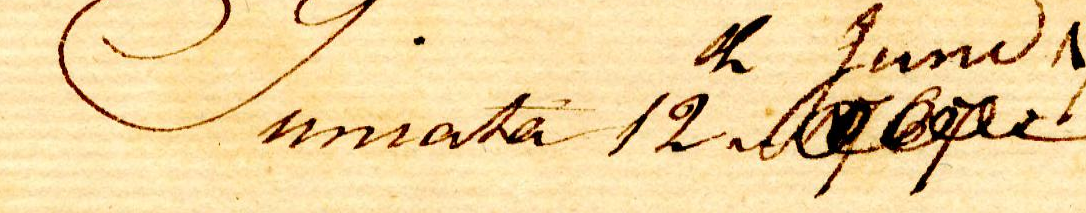Juniata 12^th [1767]
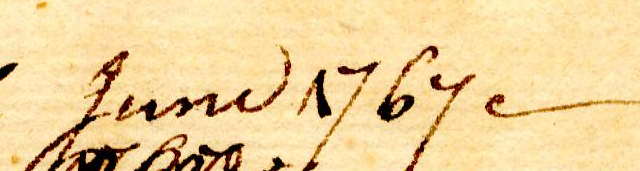June 1767
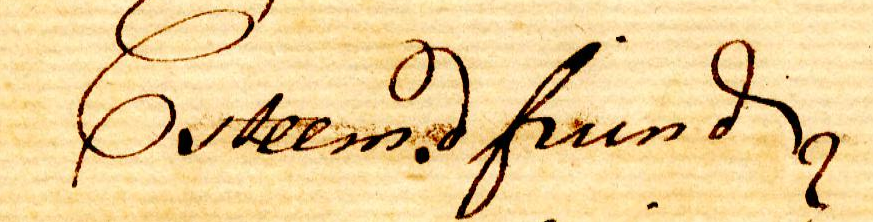Esteem'd friend
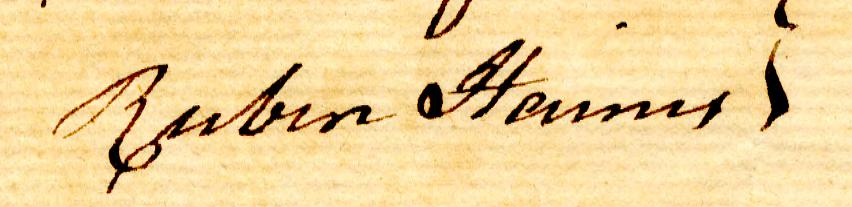Ruben Haines
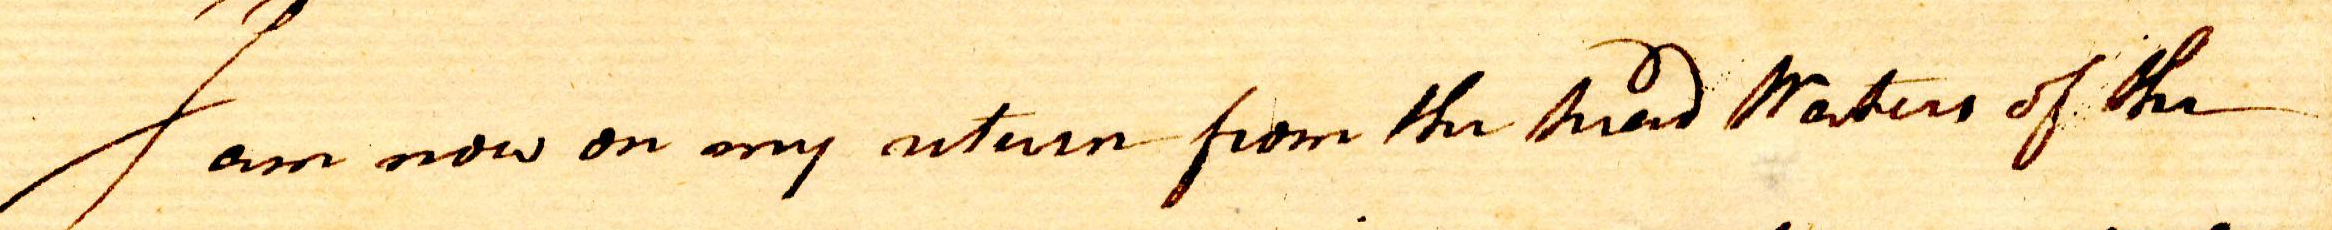I am now on my return rom the mad Waters of the
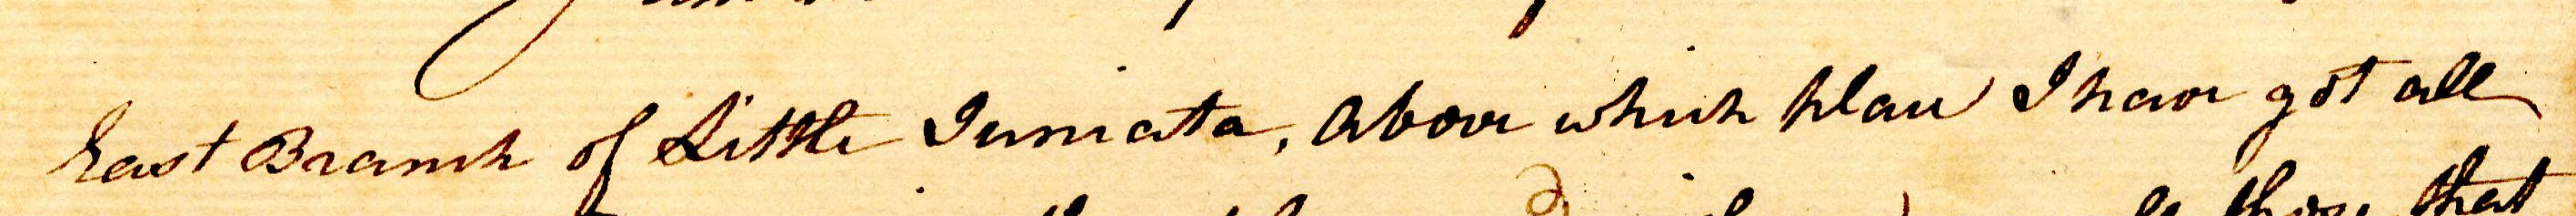east Branch of Little Juniata, above which plan I have got all
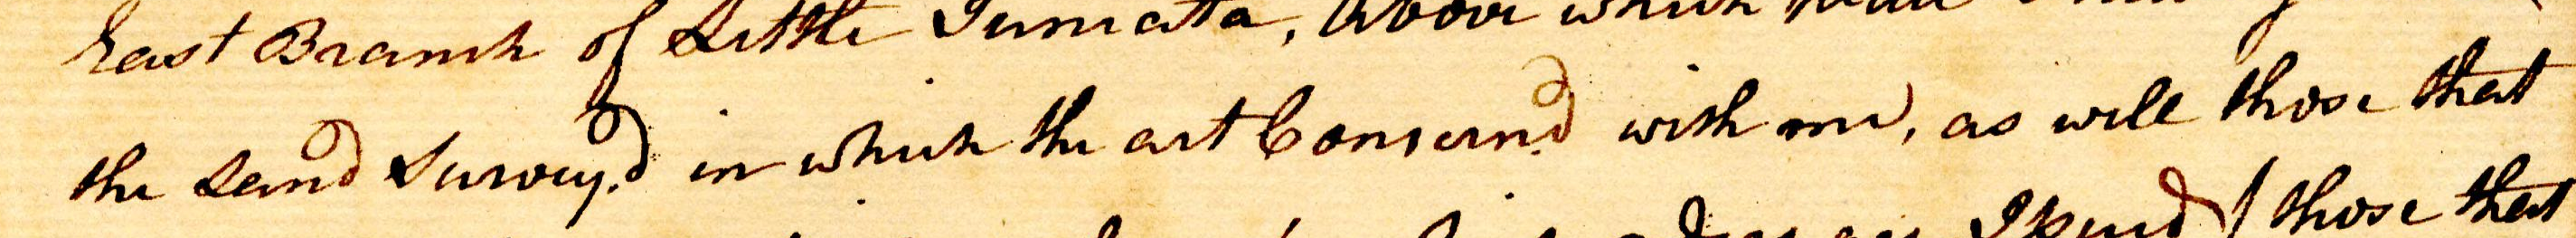the Land survey'd in which the art Consernd with now, as well those that
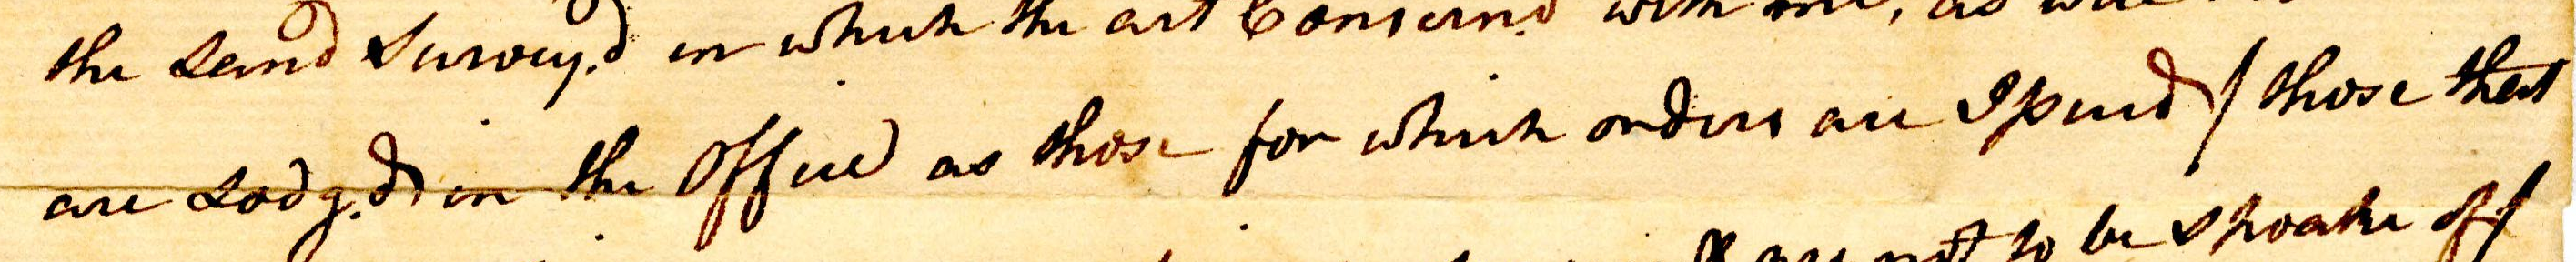are Lodg'd in the Office as those for which orders are Issued / those that
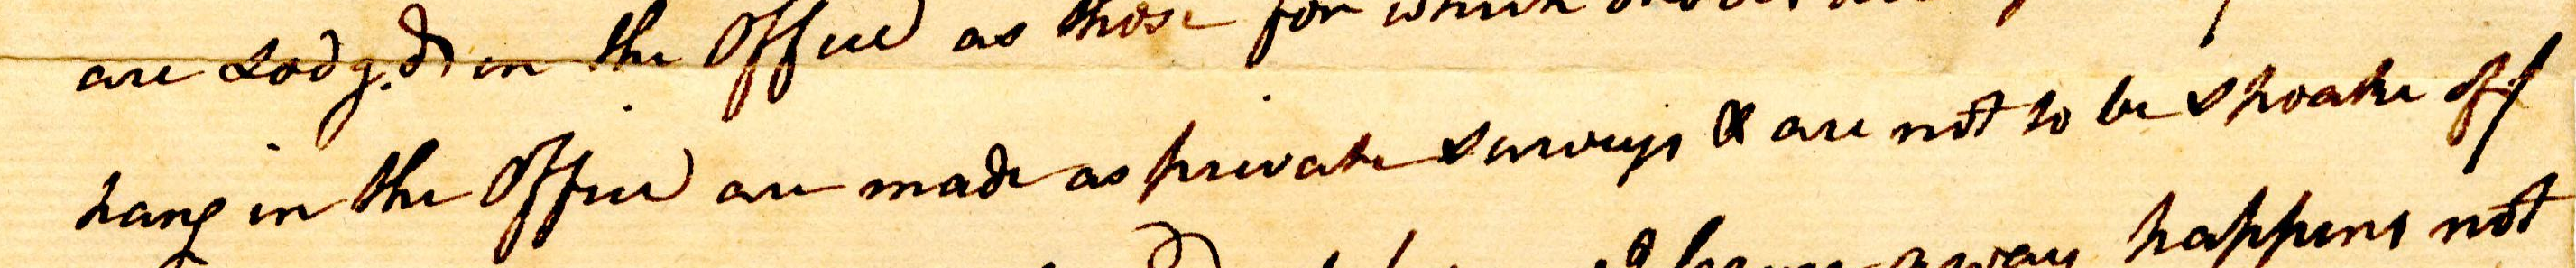hang in the Office are made as private surveys & are not to be spoake of /
